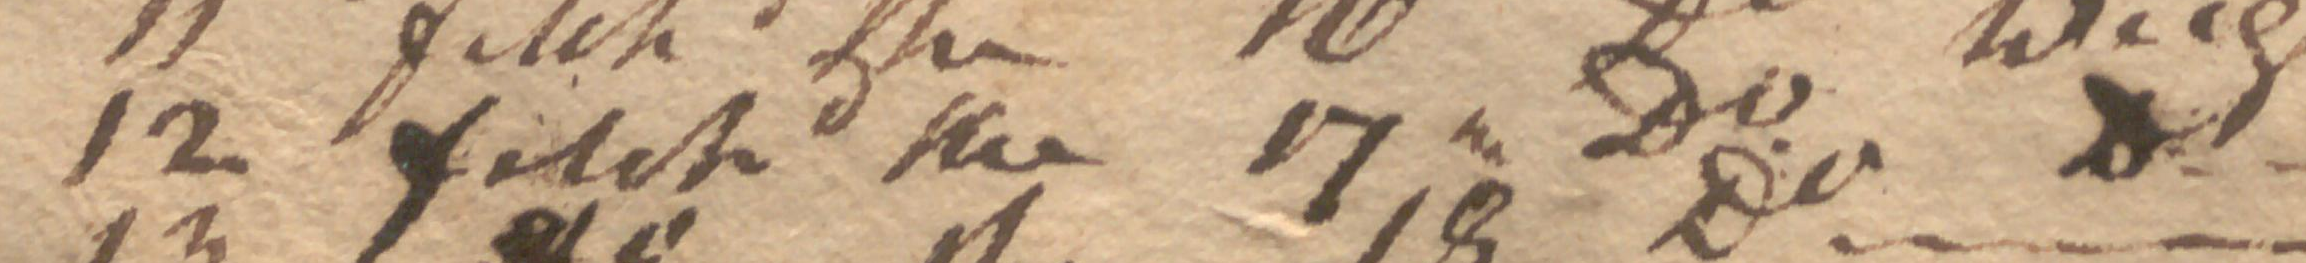12 fetch^d the 17. D^o. D^o.
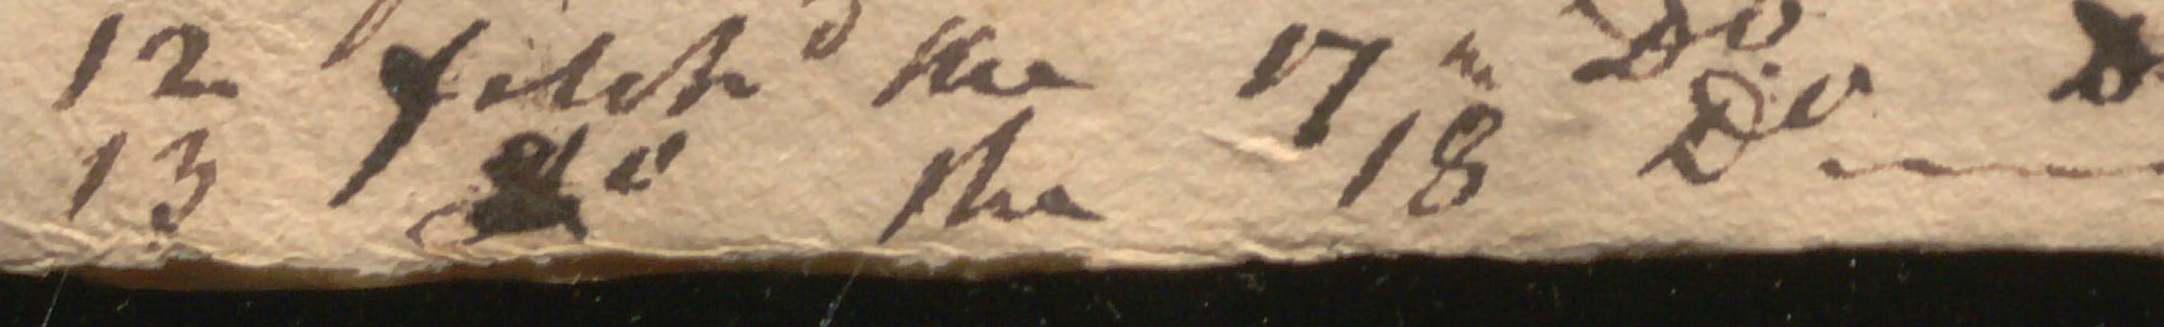13 D^o the 18^th D^o-
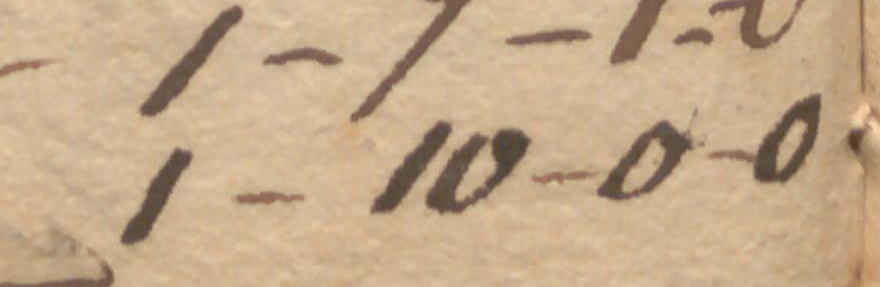1-10-0-0
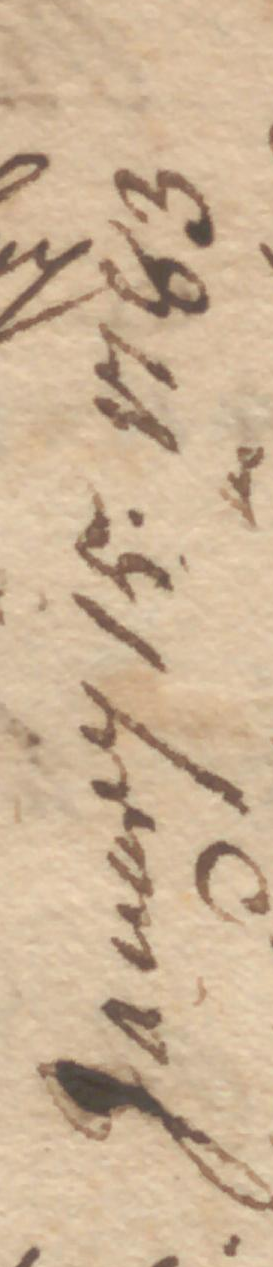Jauar^y 15. 1783
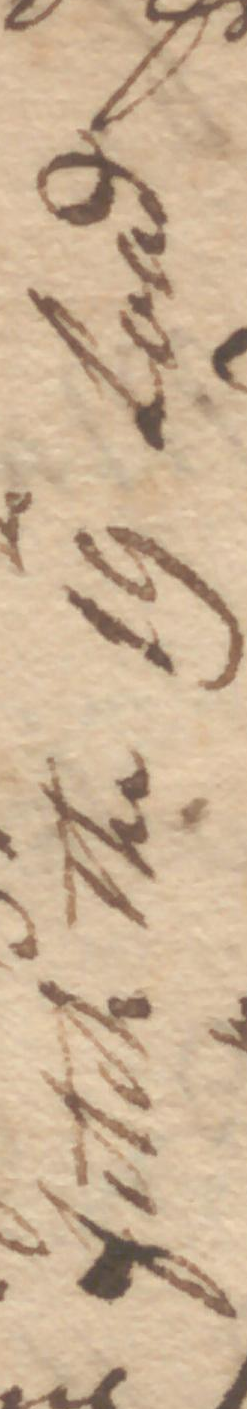fetch^d the 19^th Load
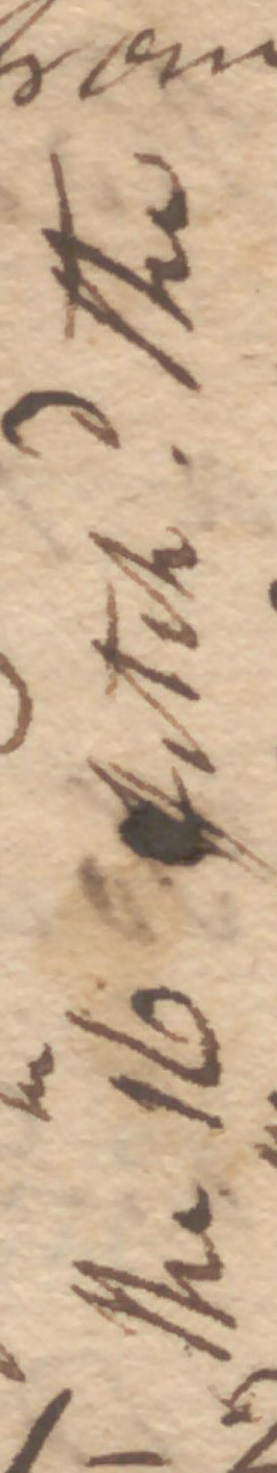the 16^th fetch^d. the
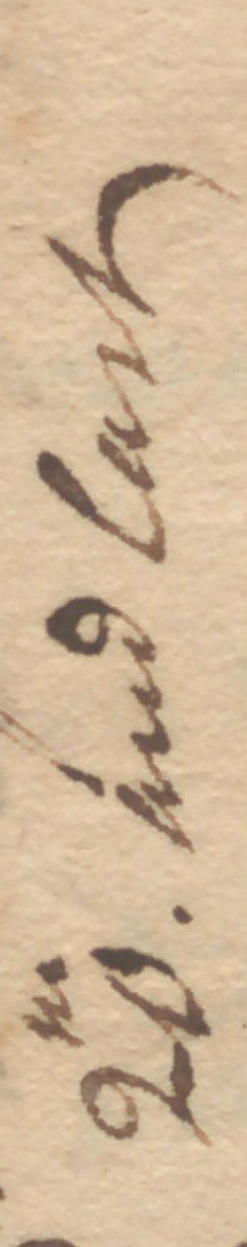20^th. and last
